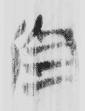於
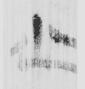少
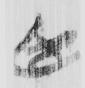臣
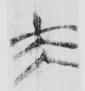夫
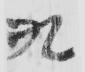九
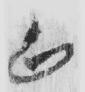㠯（以）
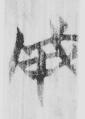成
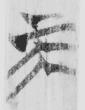天
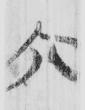六
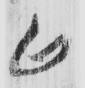㠯（以）
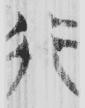行
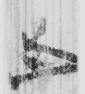之
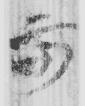可
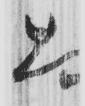也
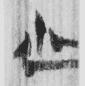少
